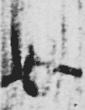夂（终）
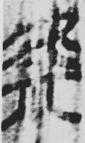{虍示}（乎）
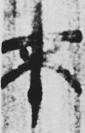不
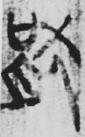猒（厭）
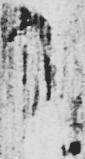人
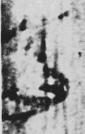兔
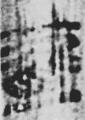蔖（苴）
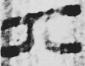亓（其）
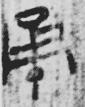甬（用）
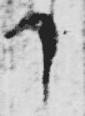人
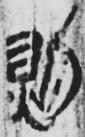則（則）
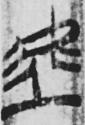○（吾）
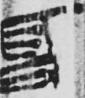取
